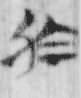於
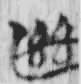○（絕）
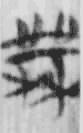無
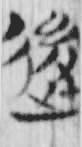○（後）
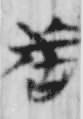者
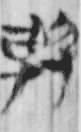與
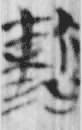漸
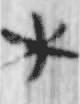木
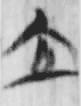立（位）
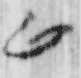㠯
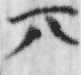亓
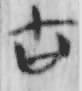古
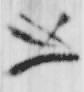之
